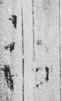古（故）
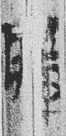陳
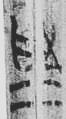爲
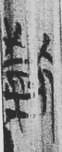新
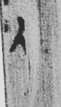人
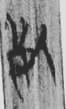死
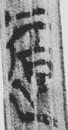○（復）
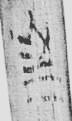爲
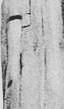人
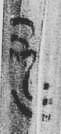水
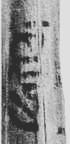○（復）
